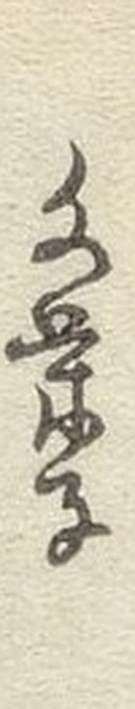文栄子
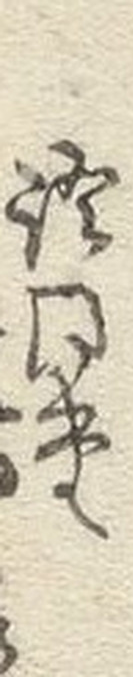語同堂
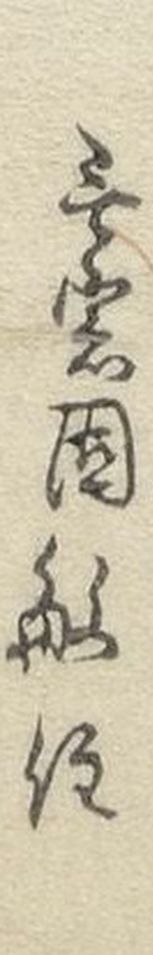無窓園敏住
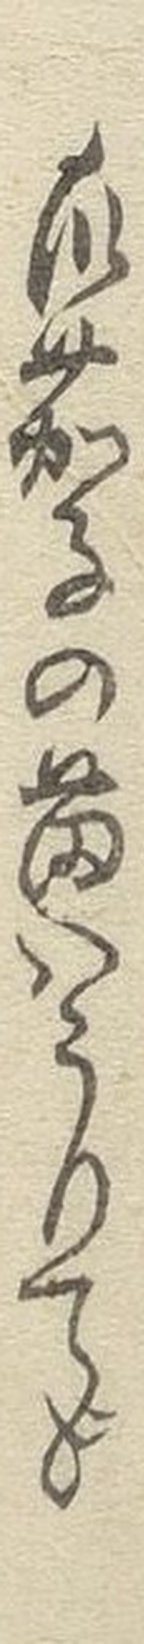瓜茄子の苗はうりても
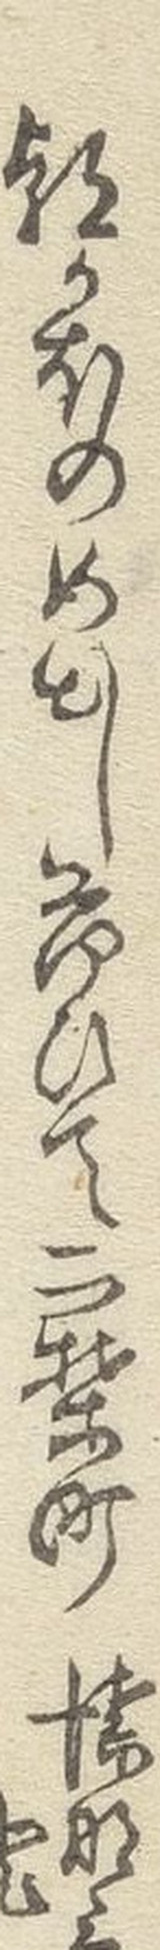朝かほのめ出し荷ひて二葉町蝶那言
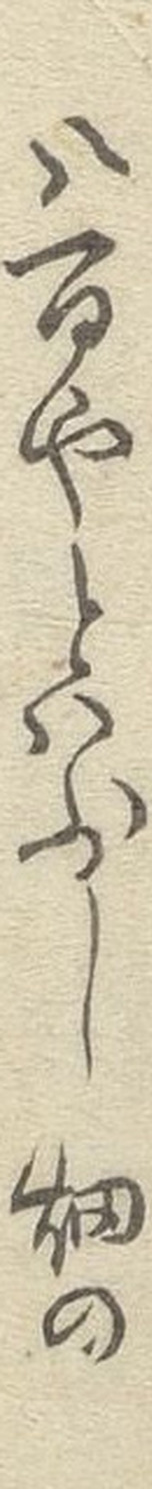八百やとは少し畑の
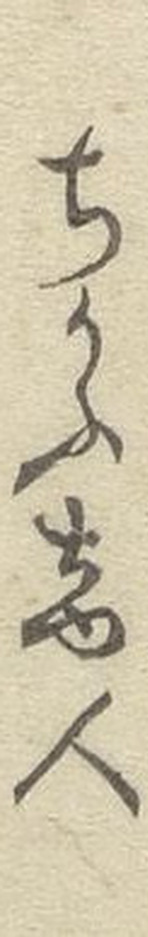ちかふ商人
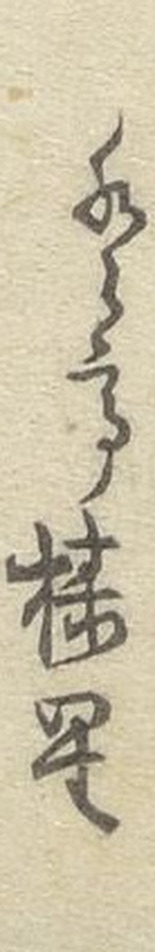水々亭楳星
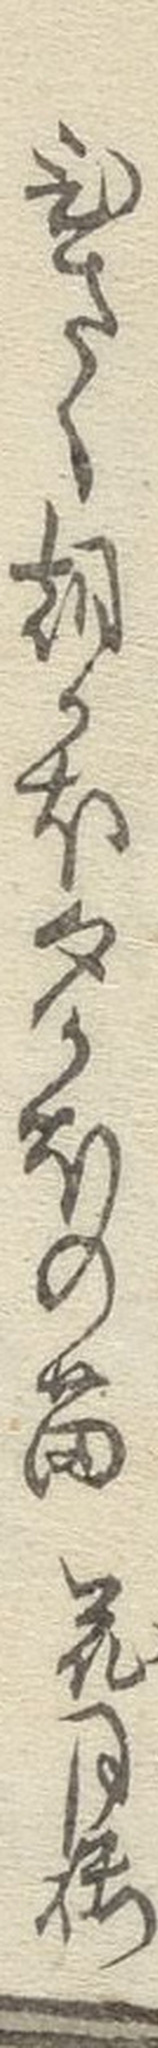ひさく朝かほ夕かほの苗花月楼
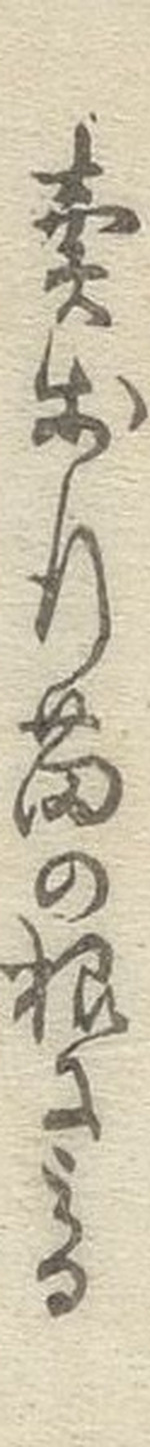売歩行苗の根にみる
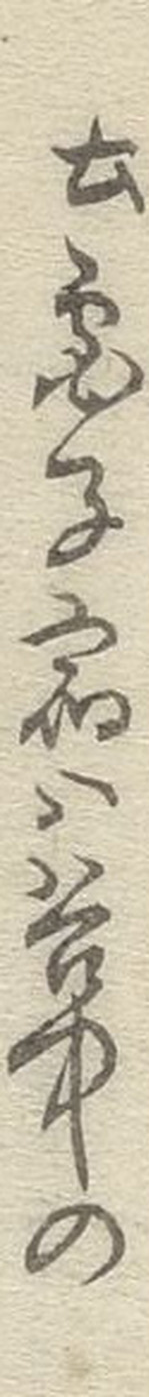土団子宿は谷中の
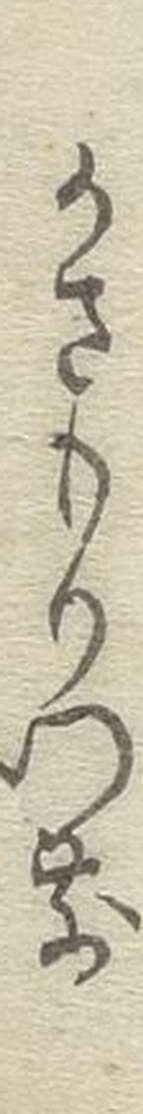かさもり門前
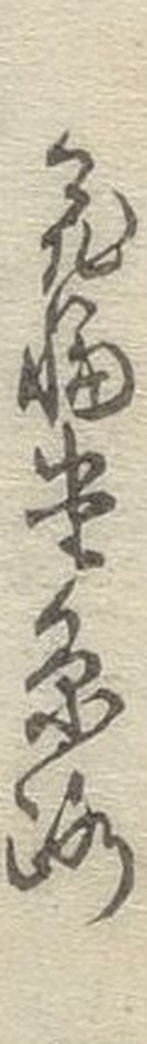花輪堂糸路

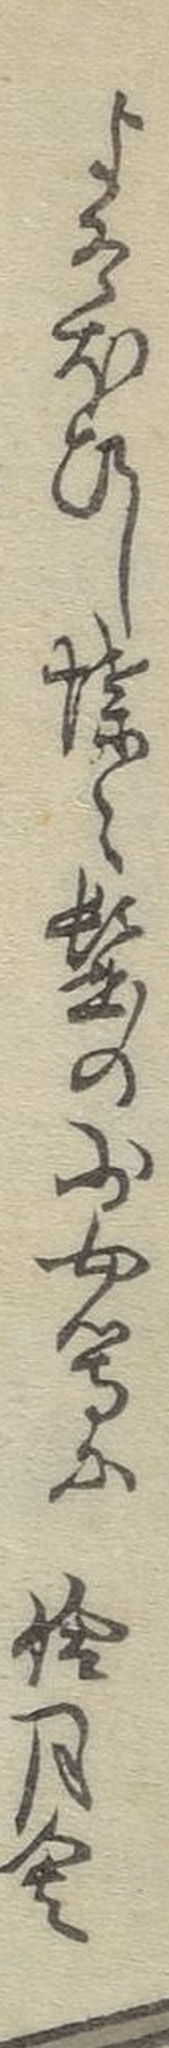よそほひし蝶々髷の少女等に伶月舎
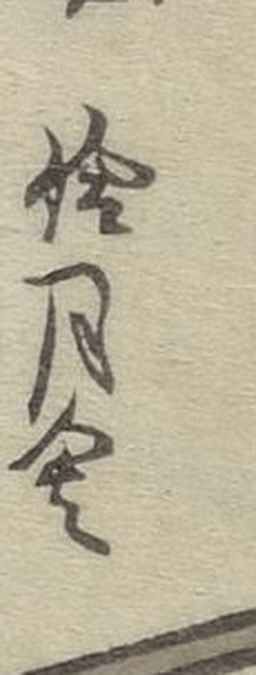伶月舎
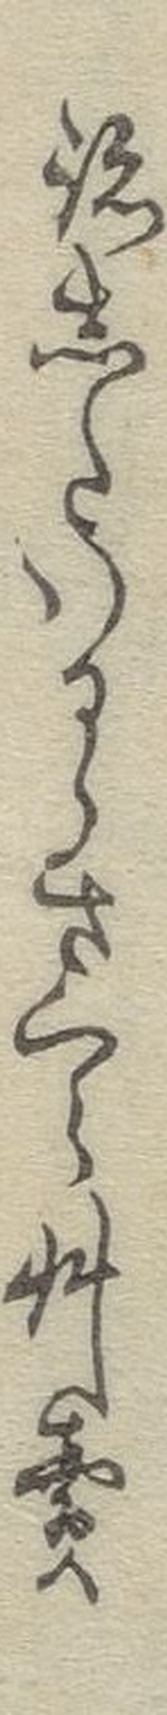跡したはるゝさくら草売
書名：Picture Album of People with Kyōka (Light Verse) (Kyōka shiki jinbutsu 狂歌四季人物)
